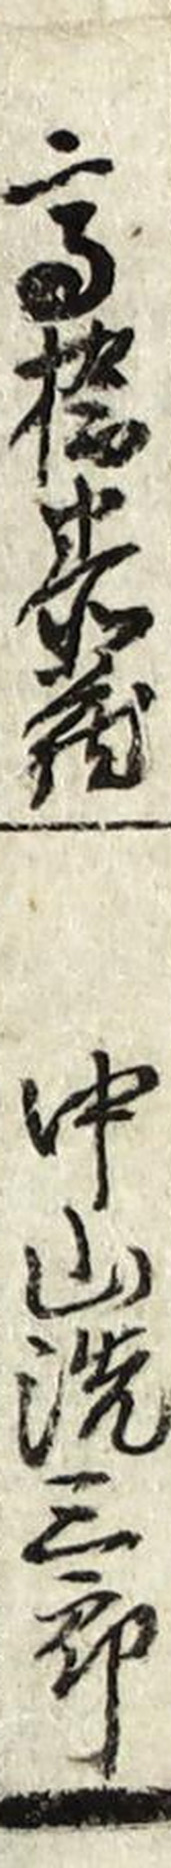高橋養蔵中山洗三郎
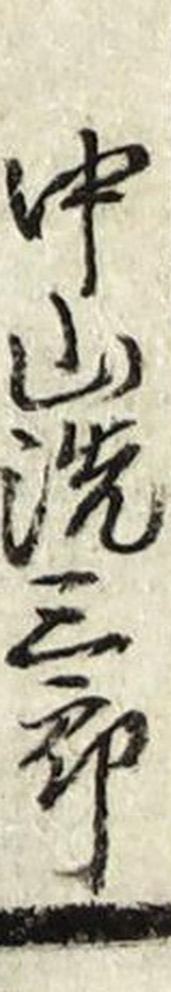中村宗三郎
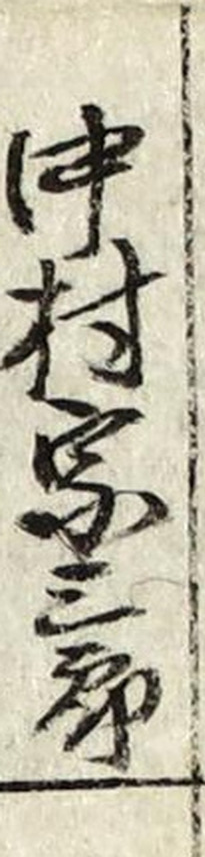中村宗三郎
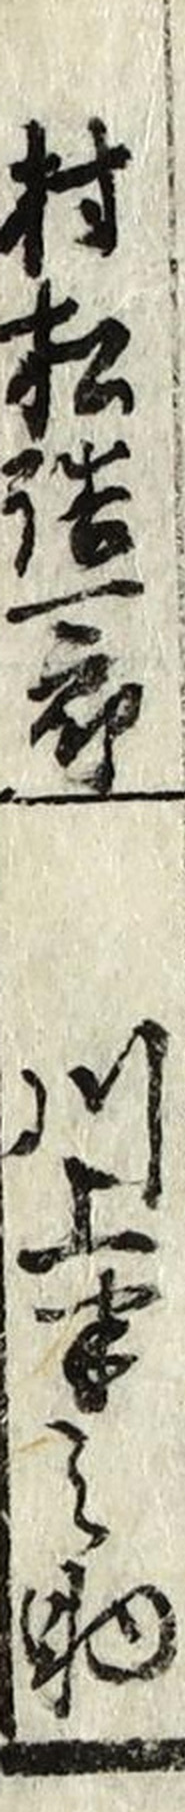村松詰一郎川上半之助
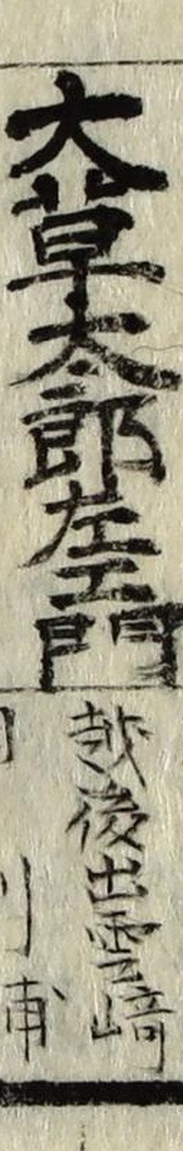大草太郎左衛門越後出雲崎
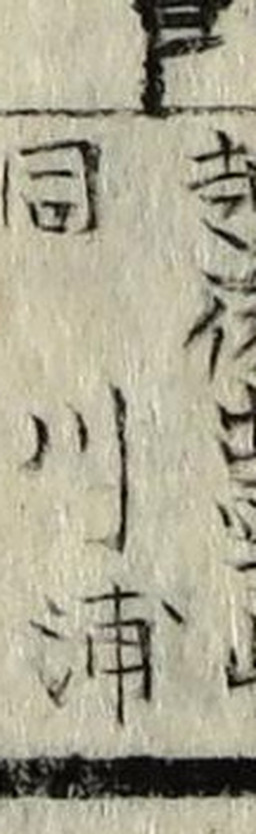同川浦
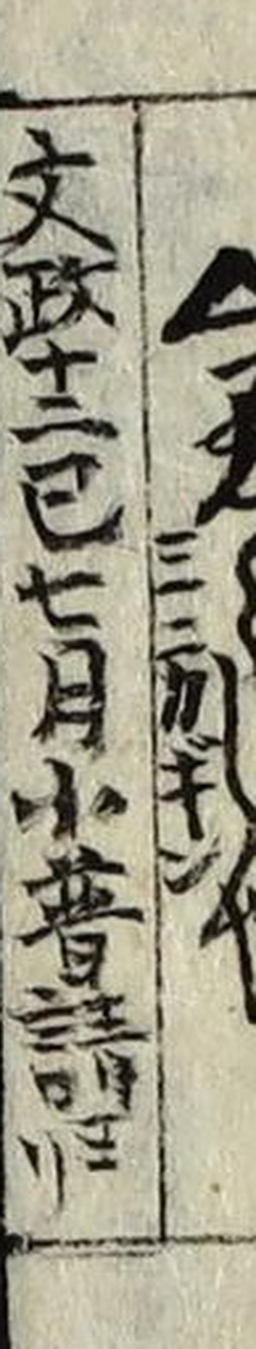文政十二巳七月小普請ヨリ
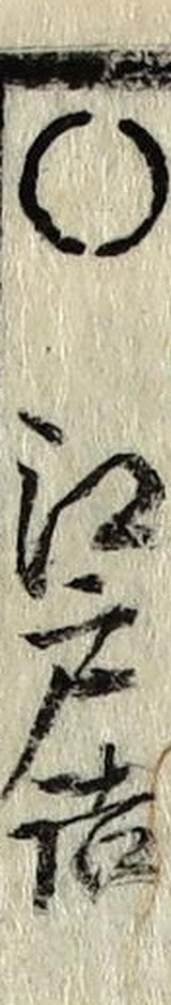○江戸詰
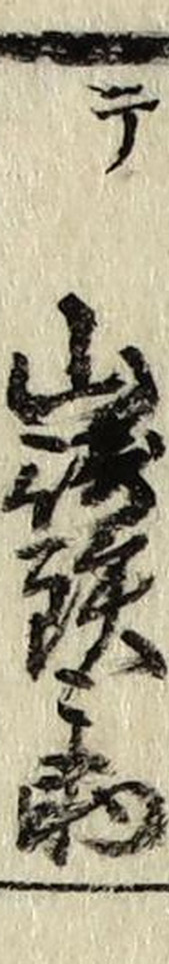テ山崎鉄之助
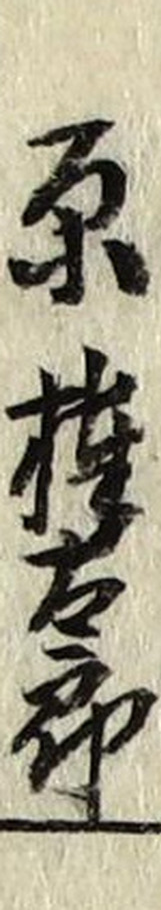原権太郎
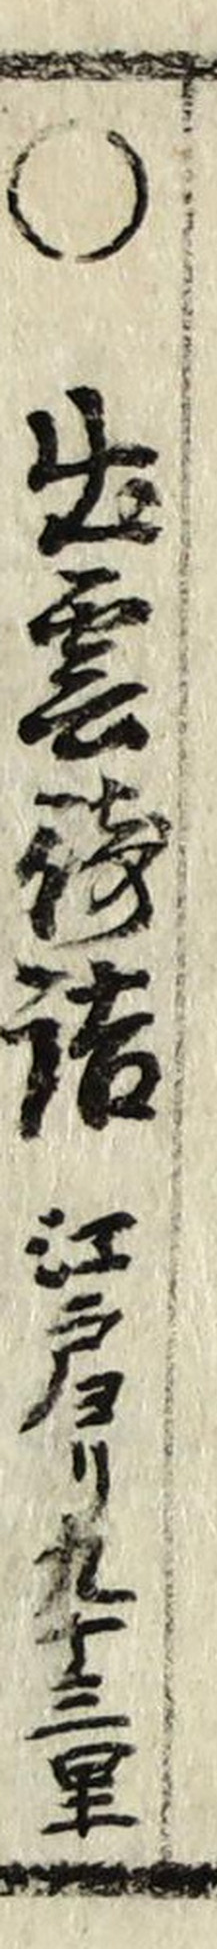○出雲崎詰江戸ヨリ九十三里
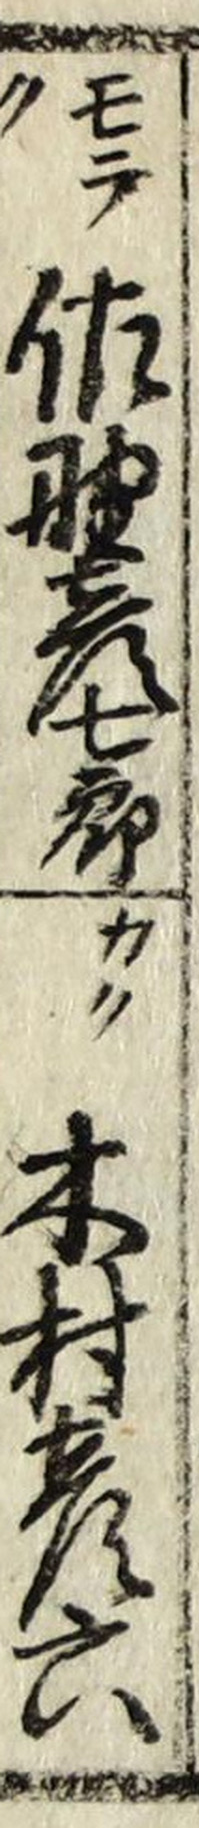モテ佐野彦七郎カ〃木村彦六
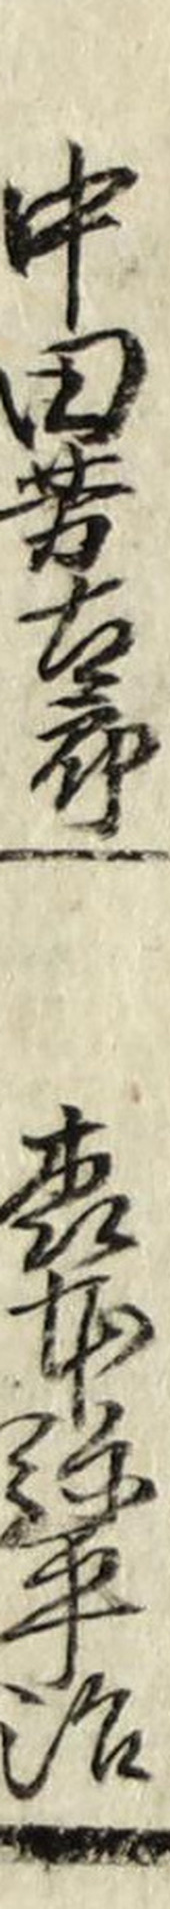中田芳太郎森本弥平治
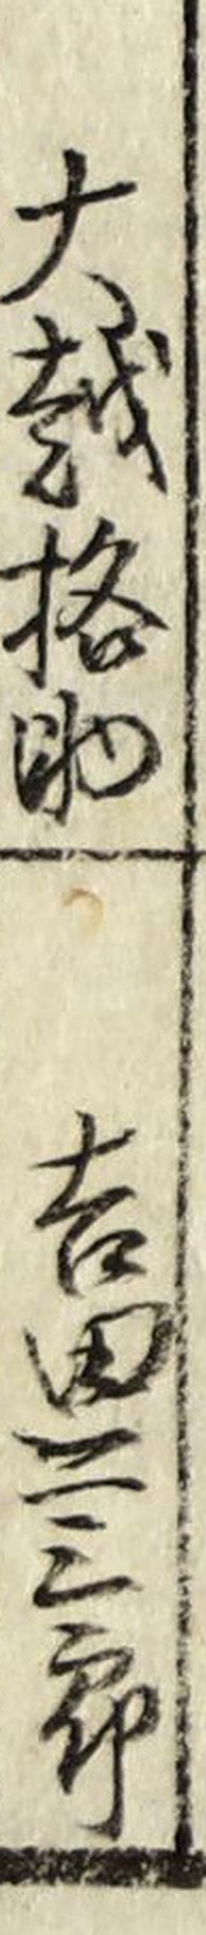大越格助吉田ニ三郎

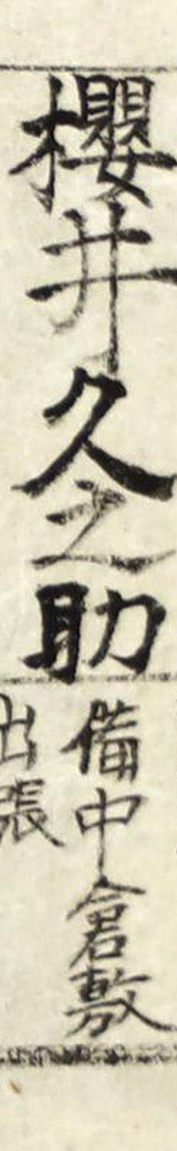櫻井久之助備中倉敷
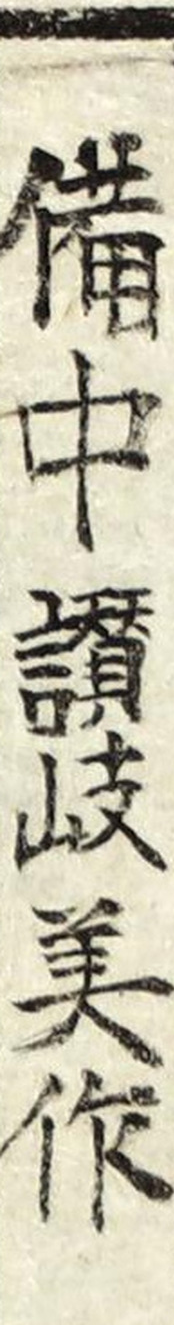備中讃岐美作
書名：（全国郡代・代官所諸役人名列）
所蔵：福井県文書館 Fukui Prefectural Archives
